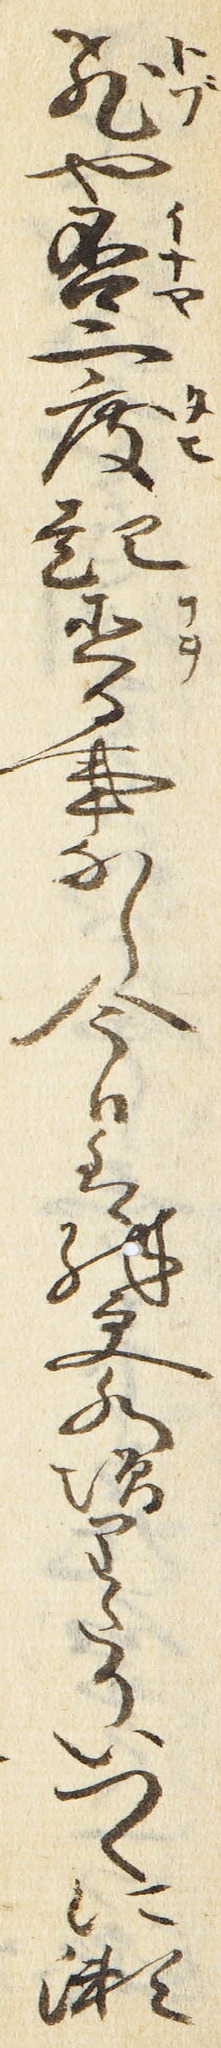飛や否二度起直る事なし今日は殊更水増りたりいつくに瀬
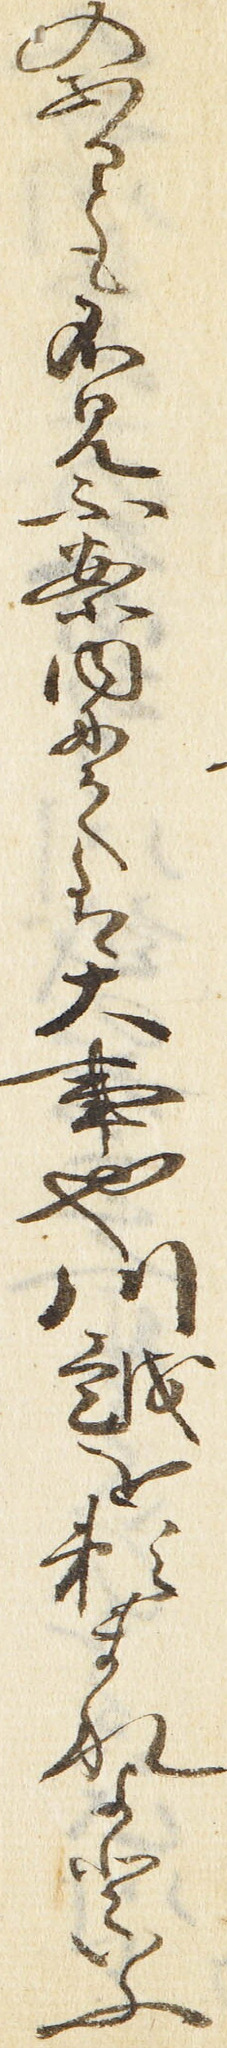のあるとも不見不案内にては大事也川越を頼まれよといふ
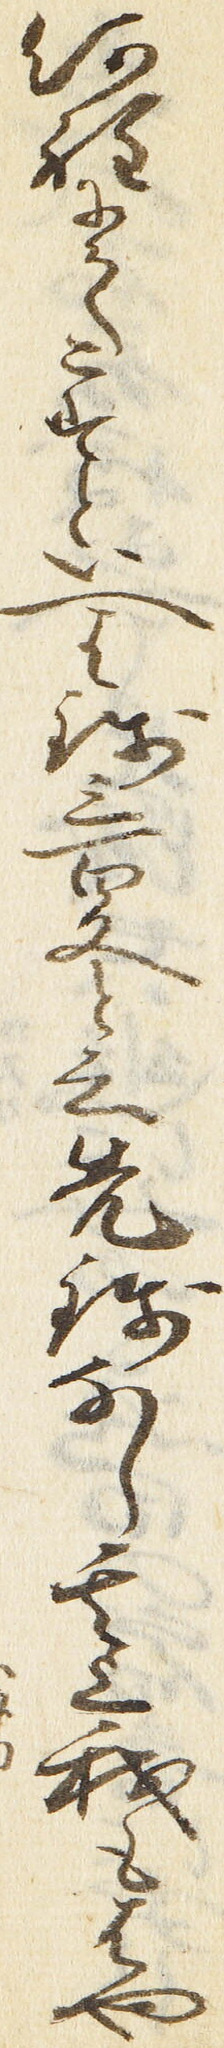何程にてこすといへは銭三百文と云先銭なし其上我もはや
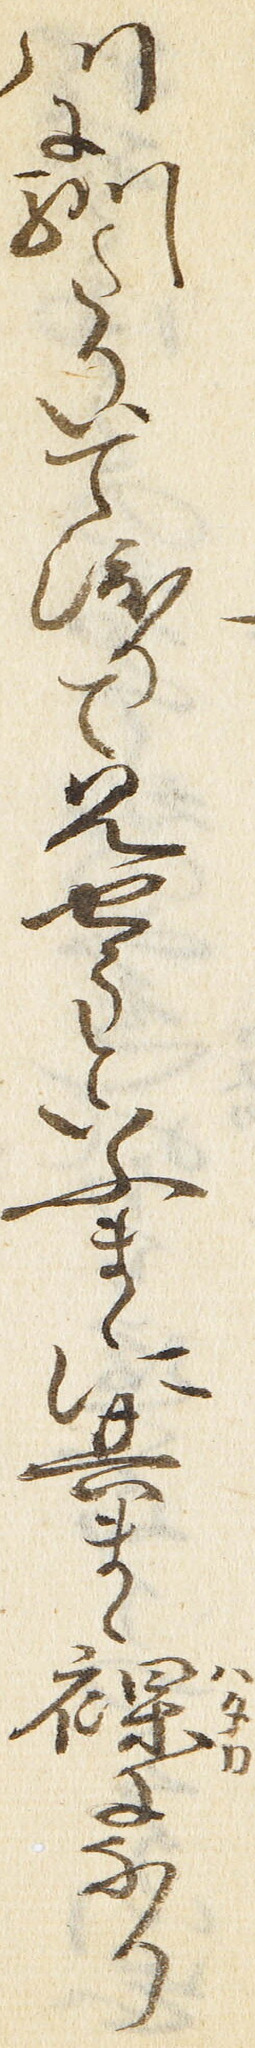川に馴たりいて渡りて見せうといふまゝに其まゝ裸になり
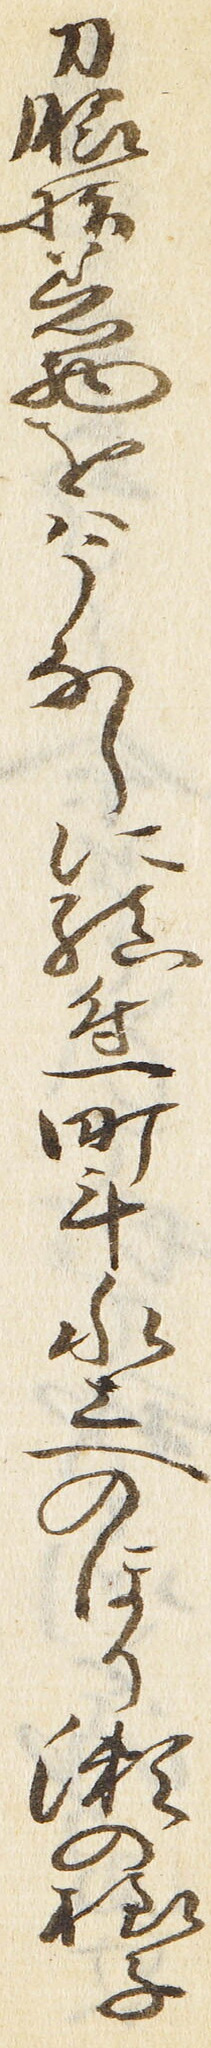刀脇指着物をはうなしに結付一町計水上へのほり瀬の様子
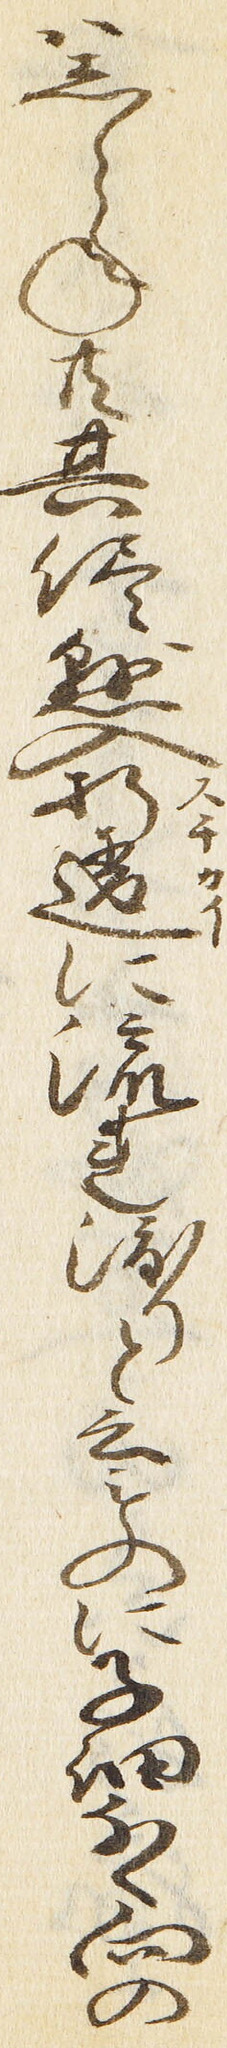はしらね共其儘懸入折違に流れ渡りと云ものに子細なく向の
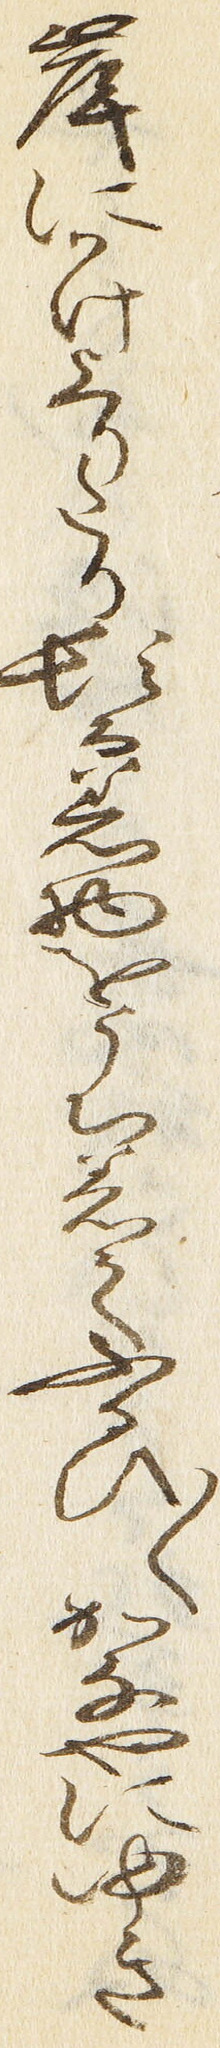岸にかけ上りたり頓而着物をうち着てふるひ〳〵かなやにゆき
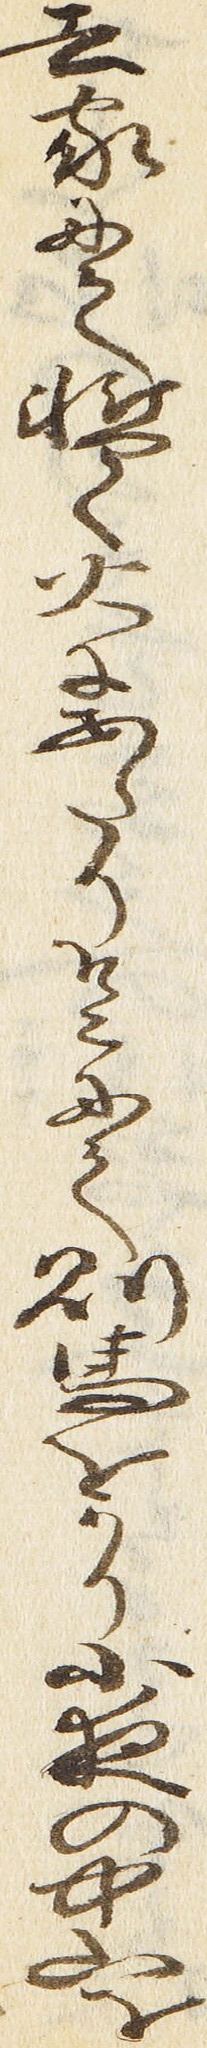去家にて暫く火にあたりそこにて則馬をかり小夜の中山を
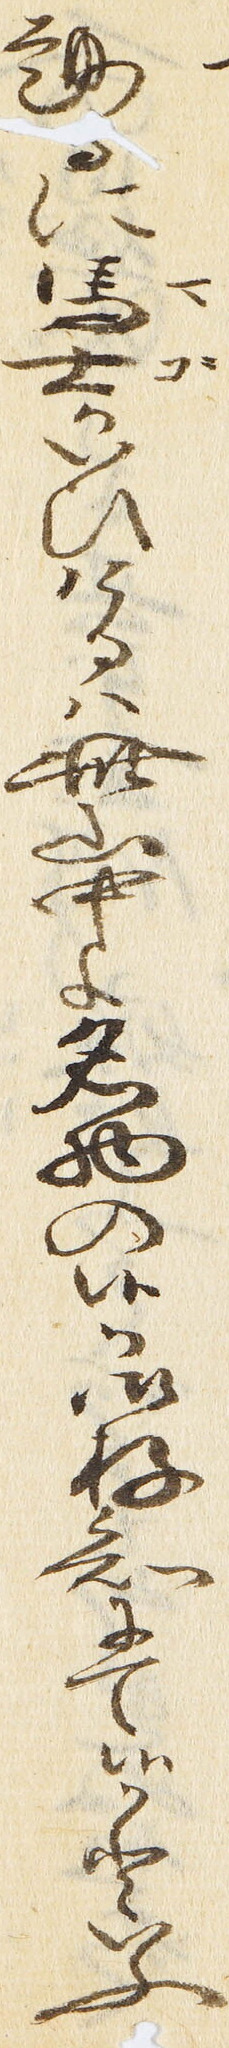越るに馬士かいひけるは此山中に名物の候か御存知にて候かといふ
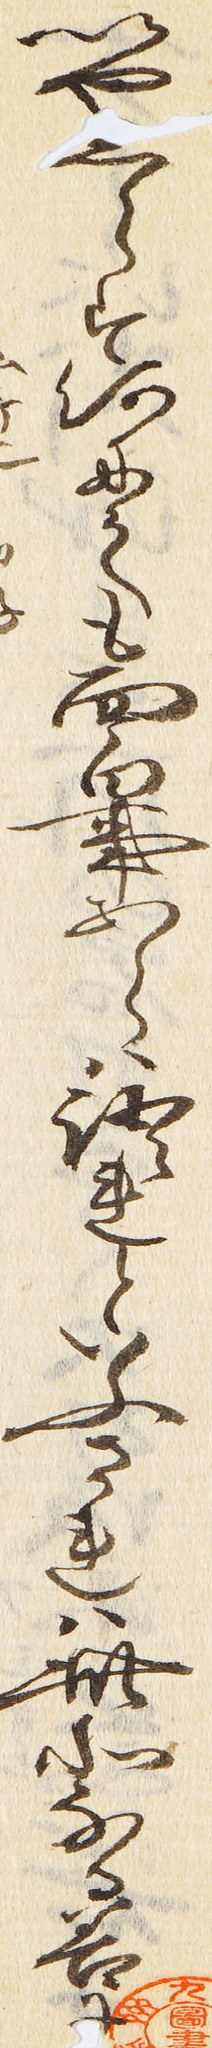いやしらす何にても面白事あらは語れといふされは此北なる谷に
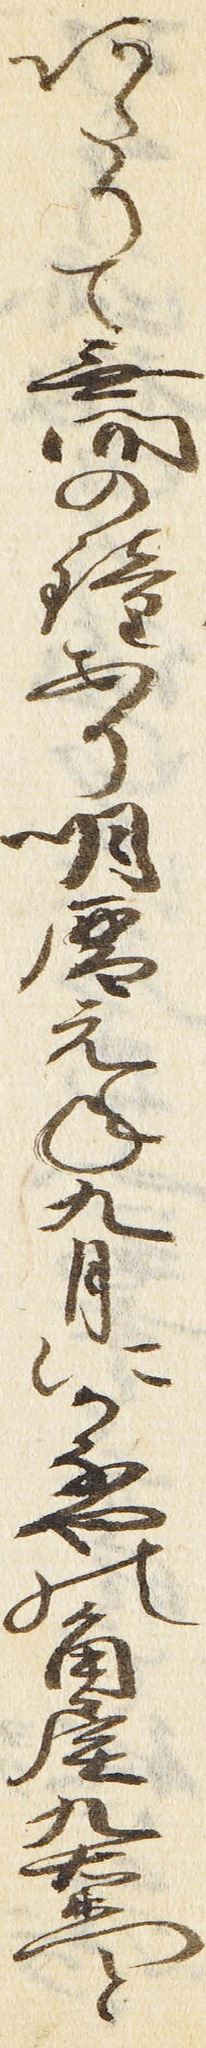あたりて無間の鐘あり明暦元年九月にかなやの角屋九右衛門と
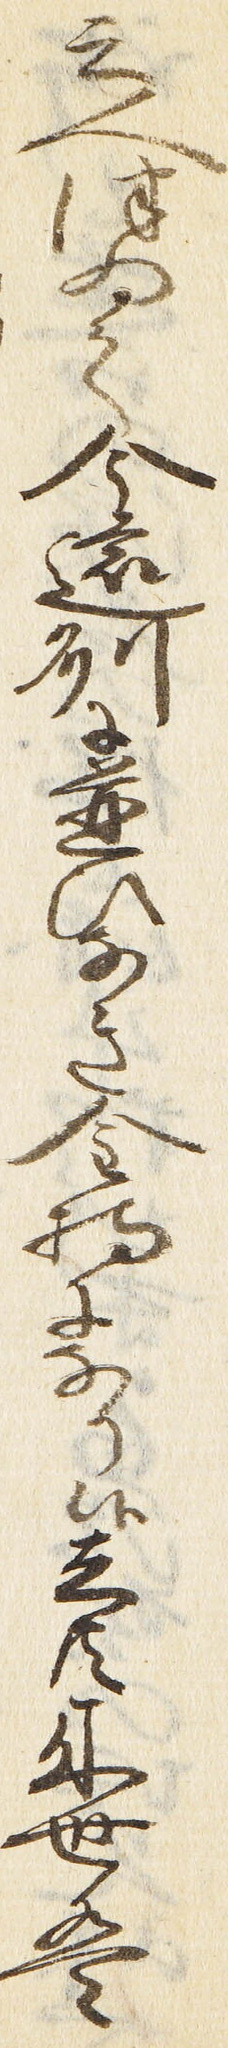云人つゐて今遠州に並ひなき金持になり候去共来世は
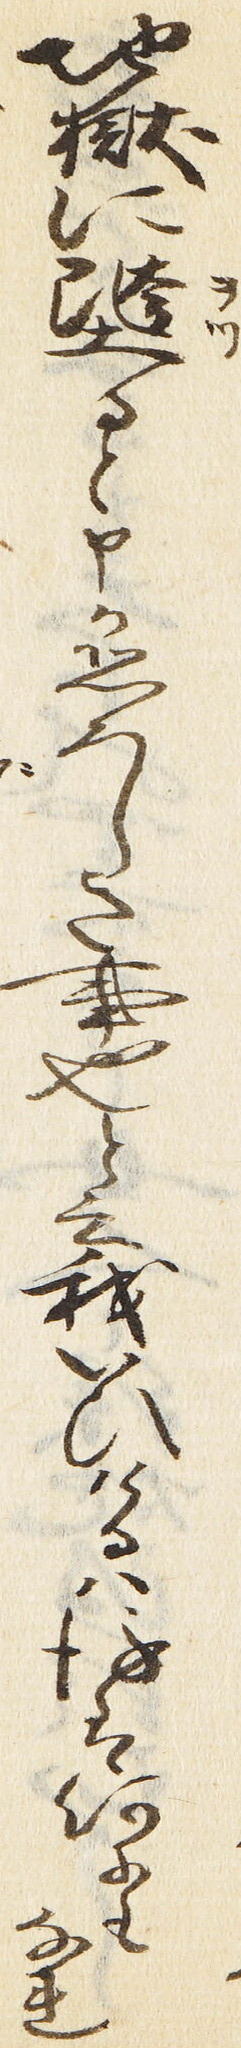地獄に堕ると申か恐ろしき事也と云我いひけるは後は何にもなれ
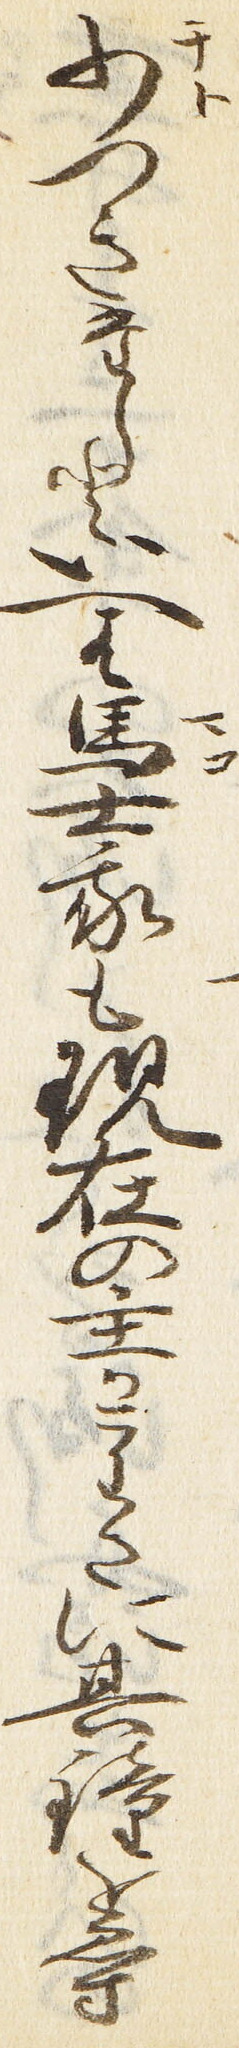少つきたしといへは馬士我も現在の主かこわさに其鐘を尋
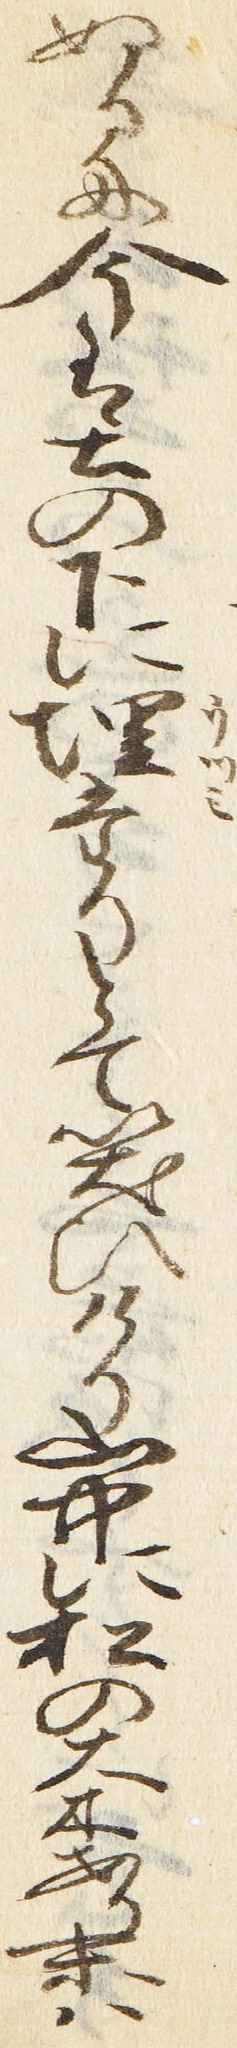ぬるに今は土の下に埋たりとて笑ひけり山中に松の大木あり末は
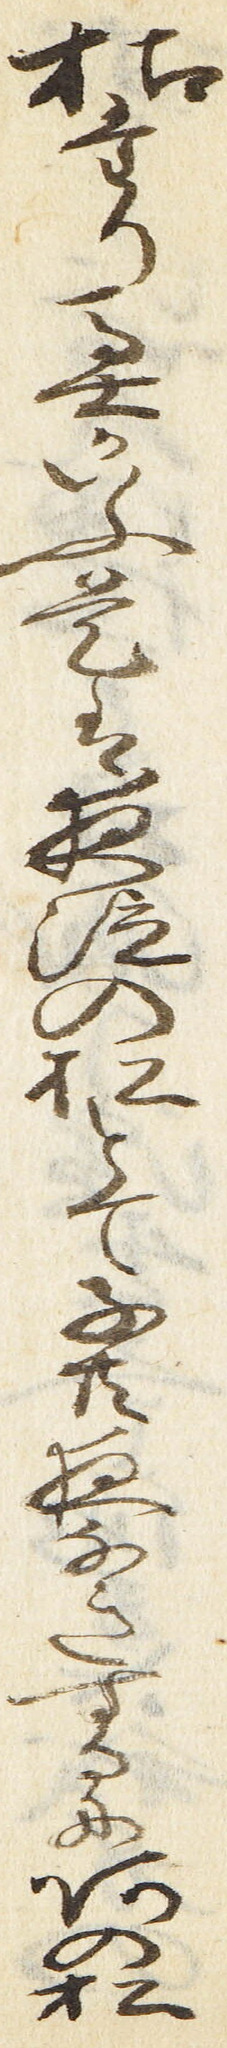枯たり馬士かいふ是は夜泣の松とて子共夜なきするにあの松
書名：海陸世話日記
